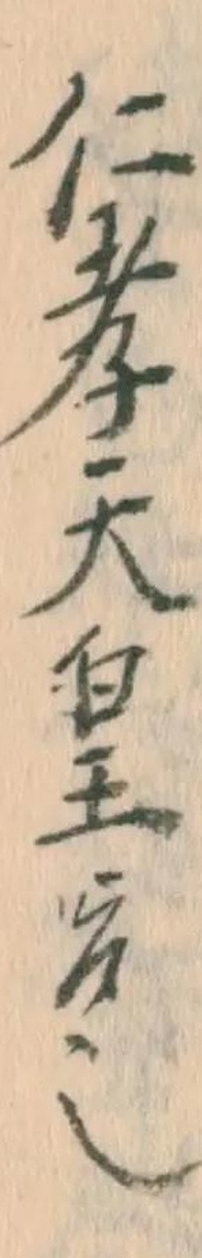仁孝天皇旨也
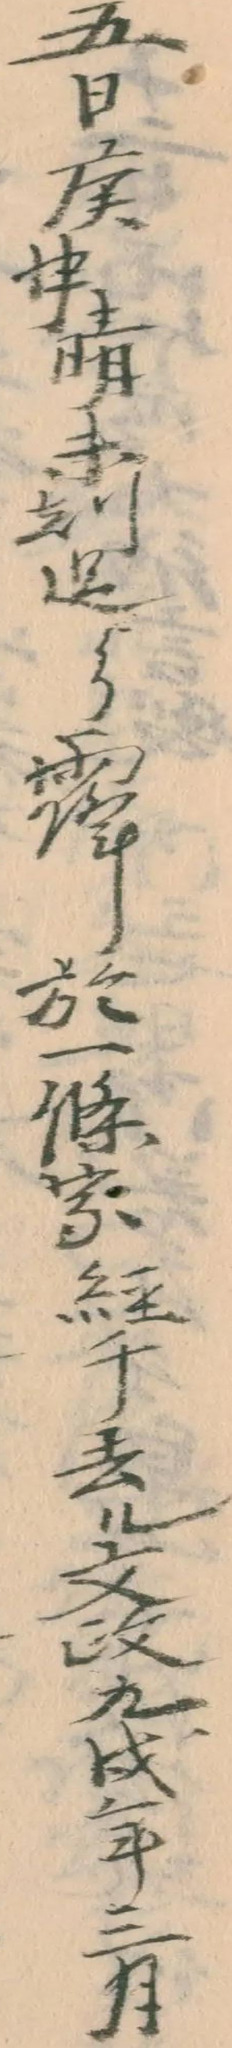五日庚申晴未刻迄より雨降於一條家経千去ル文政九戌年三月
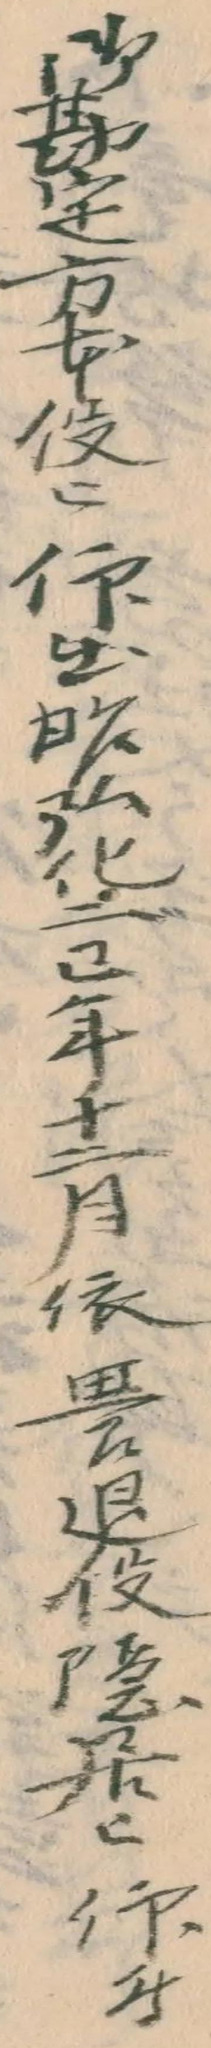御勘定方本役被仰出昨弘化二巳年十二依思召退役隠居被仰付
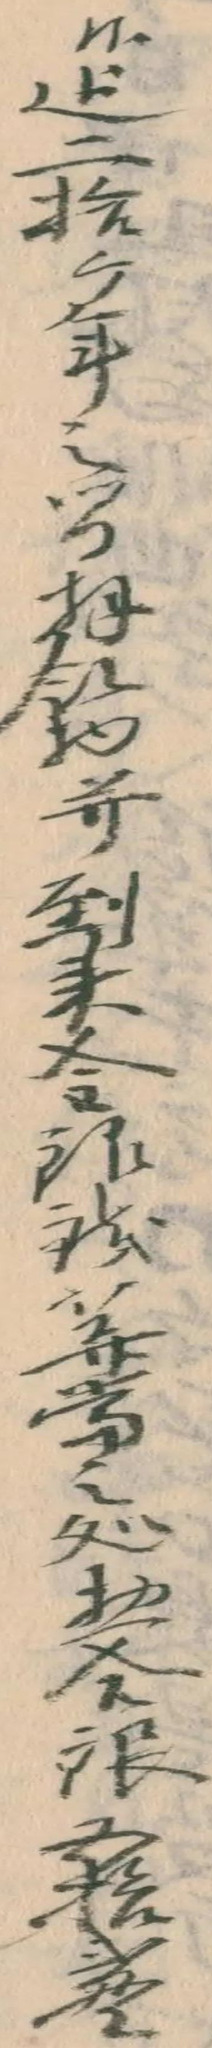候迄二拾ヶ年之間拝領物并到来金銀銭算當之処惣合銀五拾弐貫匁
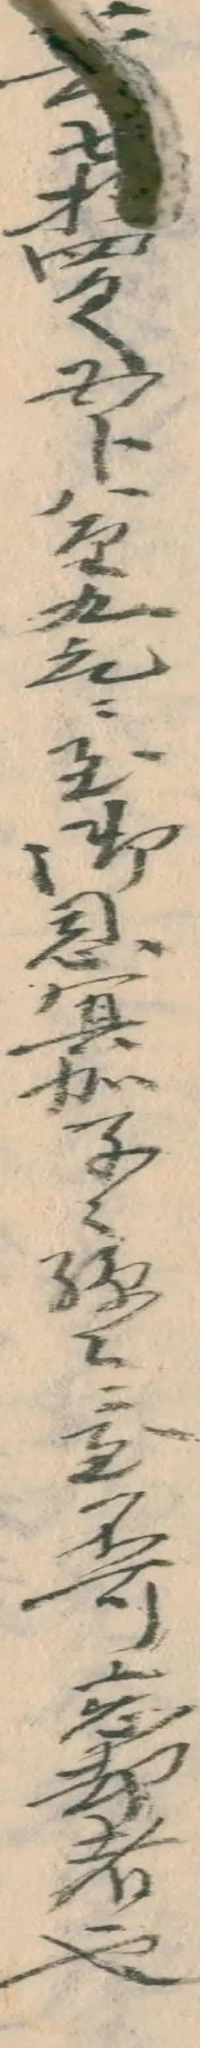七拾四匁五分八厘九毛ニ至御息冥加子々孫々ニ至不可忘却者也
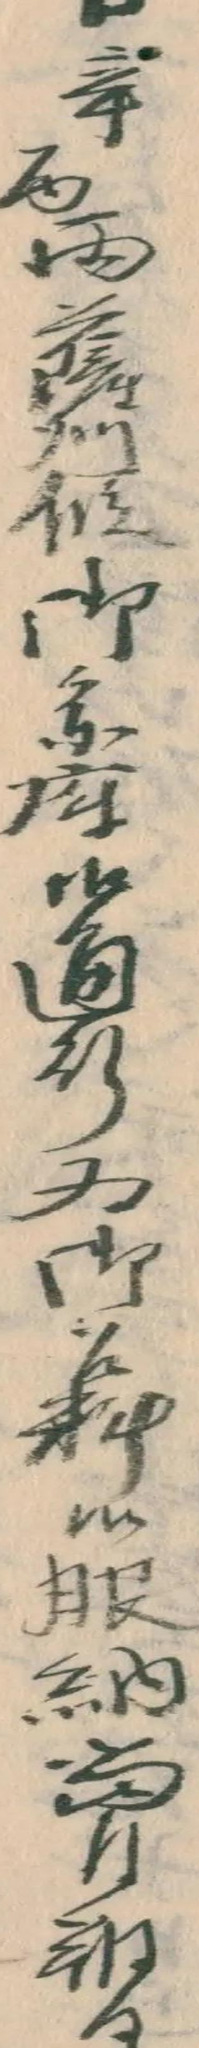六日辛酉薩州殿御参府御通行為御召料候服納當月朔日
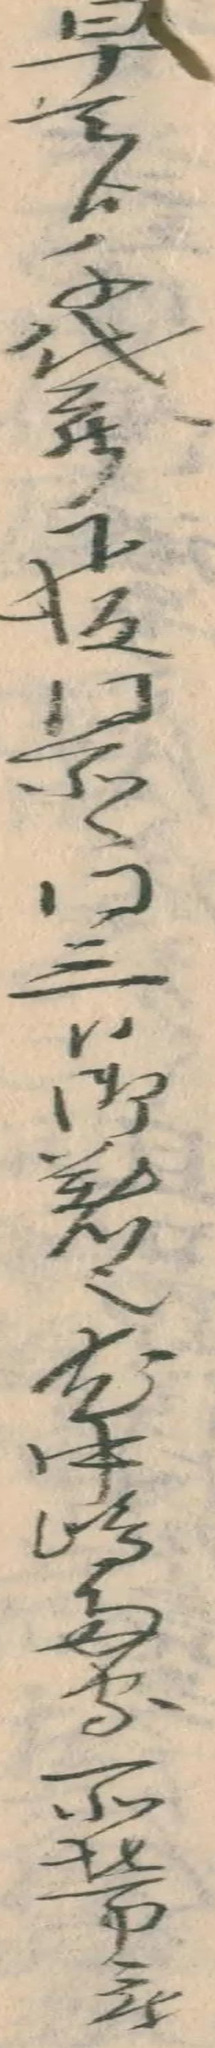早天ゟ千代蔵下坂同所へ同三日御着也尤中嶋多家所労ニ付
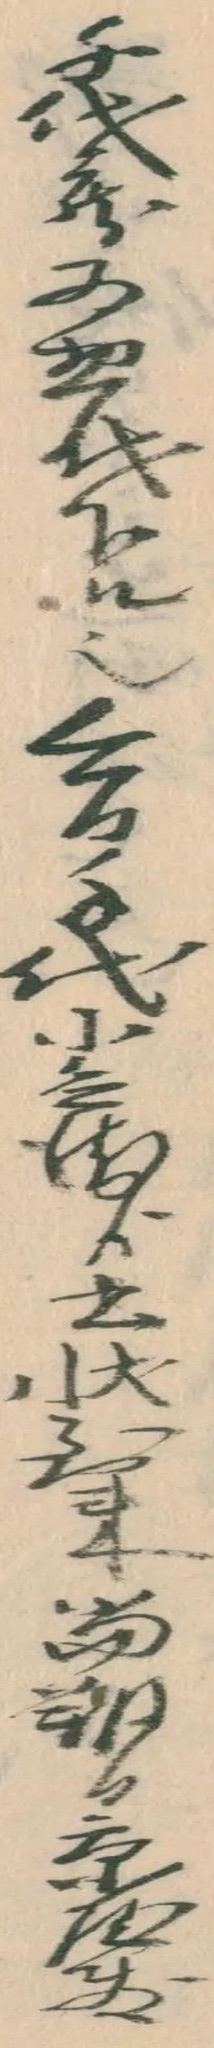千代蔵為惣代下ル也今日手代小兵衛ゟ書状到来當朔日京屋敷
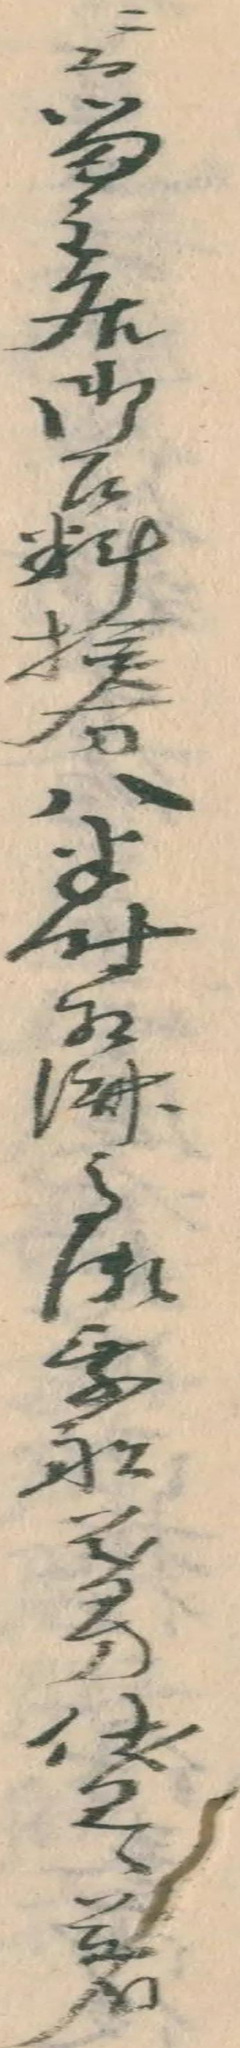ニ而留主居御召料検分八半時相済候様乗舩暮方伏見ヘ着
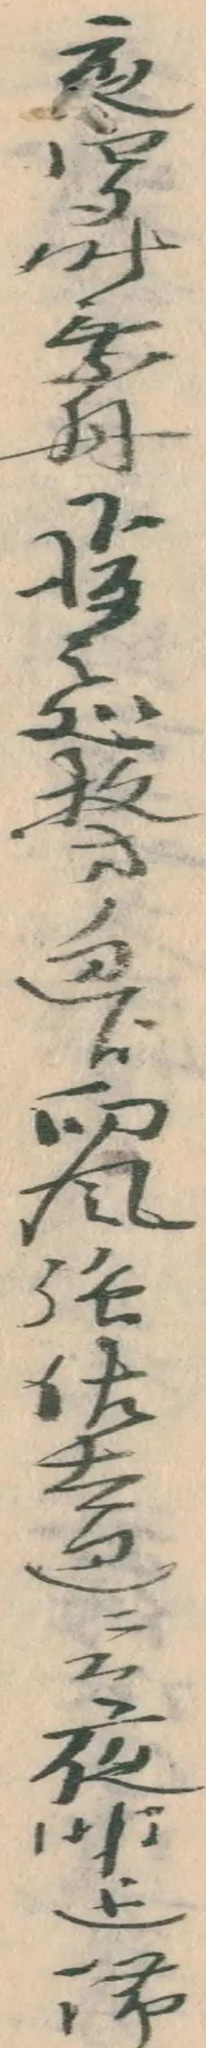夜四ツ時乗舟下坂之処枚方之辺ゟ西風強佐太辺ニ而夜明迄帰
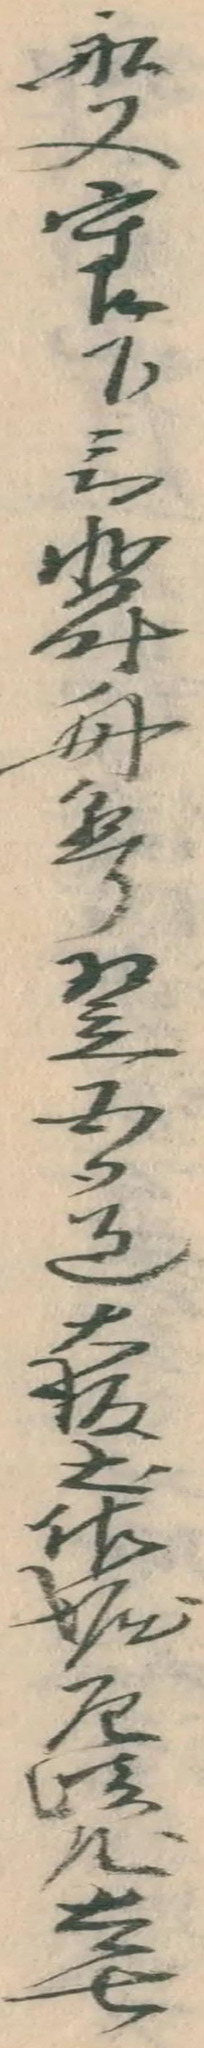船又守口下ニ而暫時舟懸り翌五日過大坂土佐堀原崎屋太七
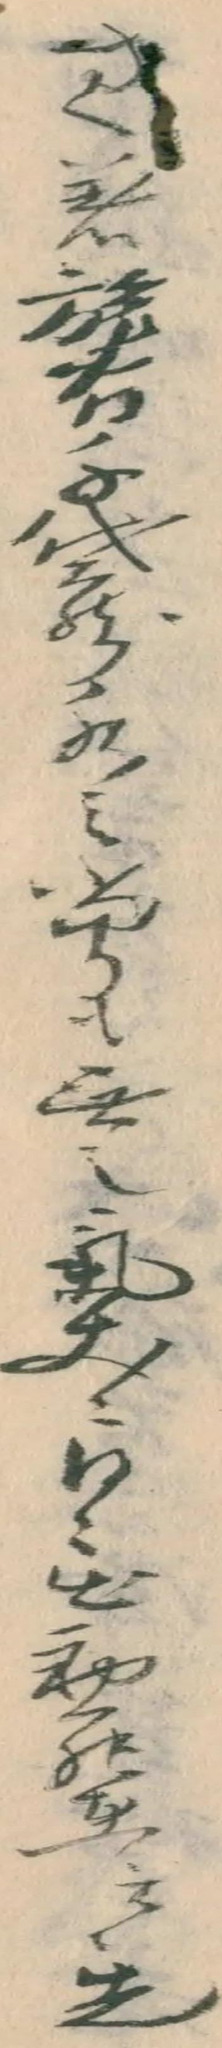方へ着旅宿千代蔵水之當りも無之気丈に日々出勤罷在云々先
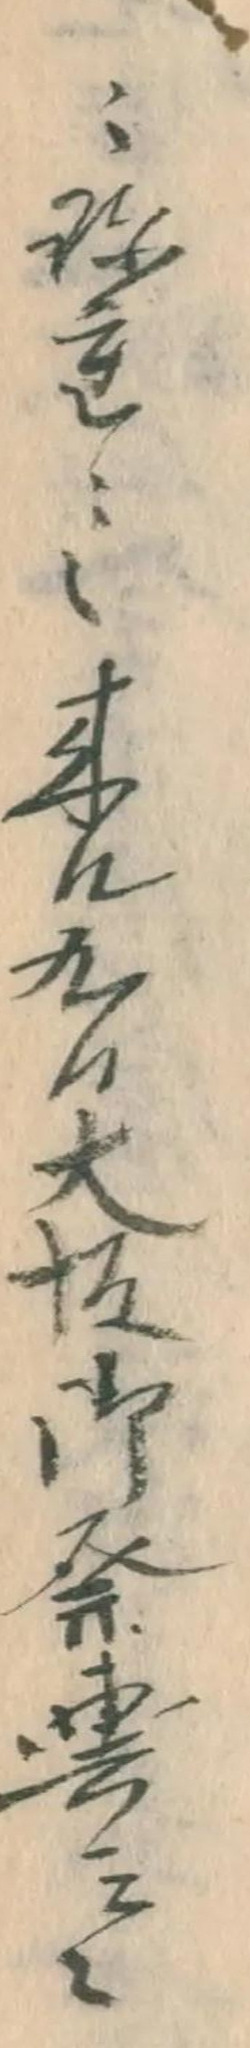〻珎重〻〻来ル九日大坂御発輿云々

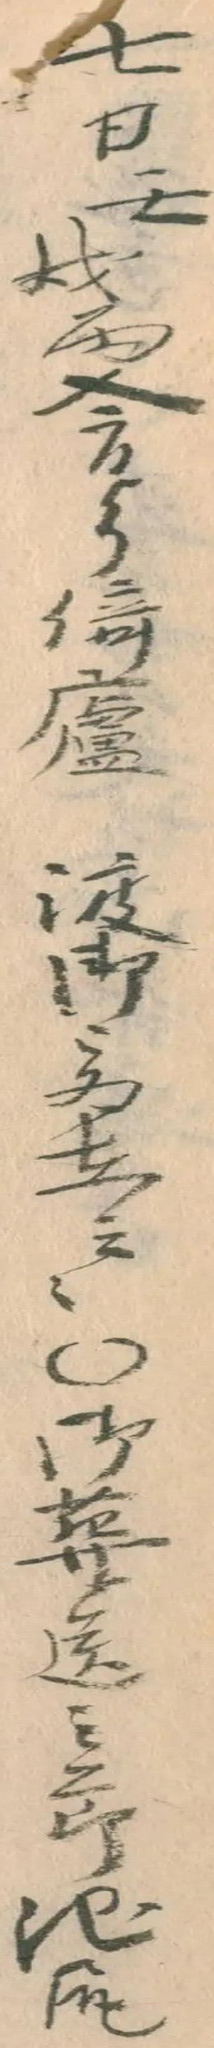七日壬戌雨今日より倚蘆渡御御為在云〻〇御葬送之節池尻
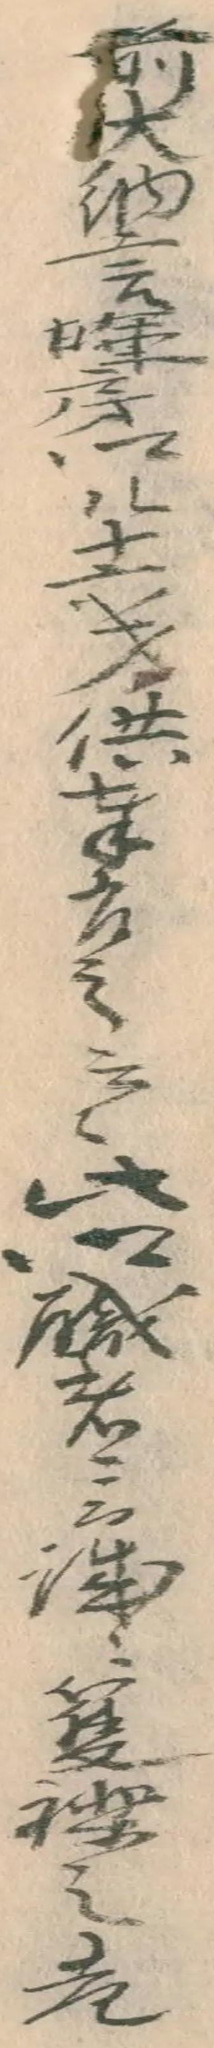前代納言暉房卿八十六才供奉有之云々此卿職者ニ而誅篗襟之老
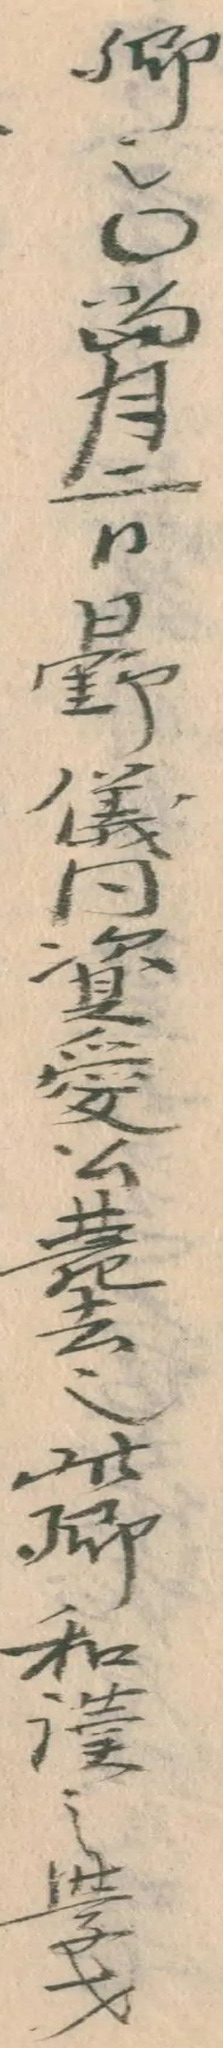卿也○當月二日日野儀同資愛公薨去也此卿和謹之學才
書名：賀茂社記録. 第70冊
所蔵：国立国会図書館 National Diet Library, JAPAN
